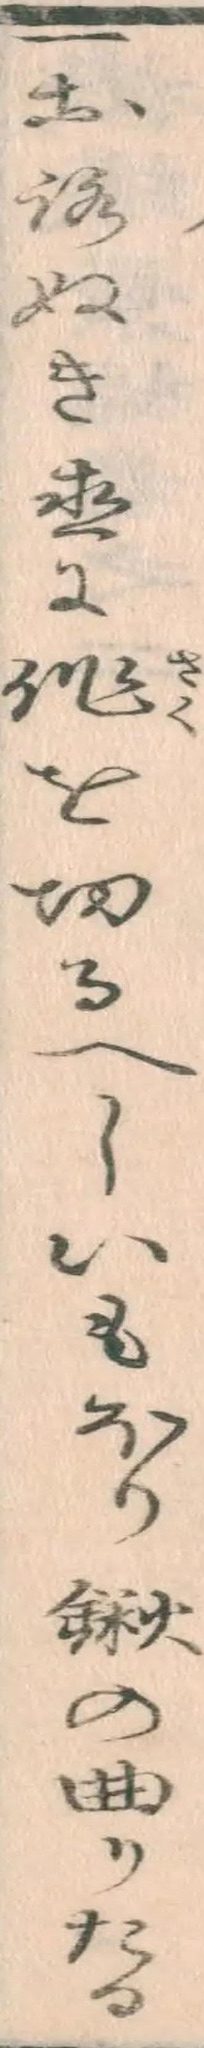一おろぬき直に作を切るへしいもほり鍬の曲りたる
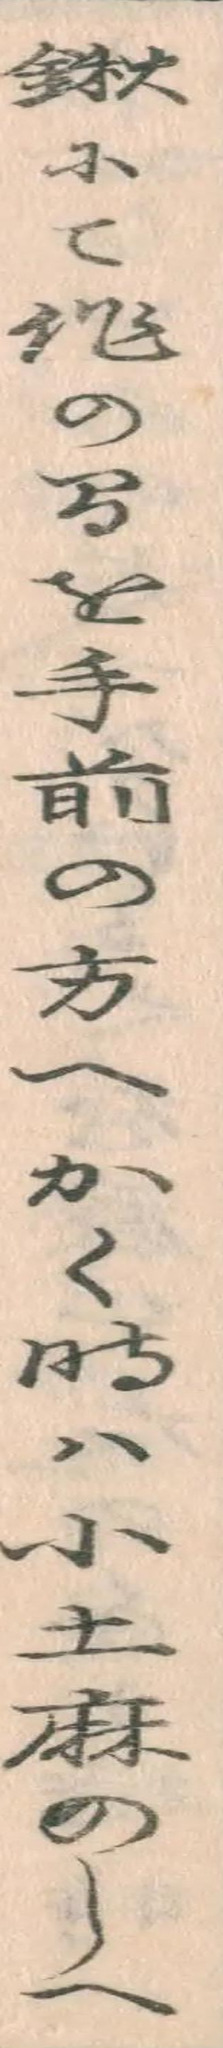鍬にて作の間を手前の方へかく時は小土麻のしへ
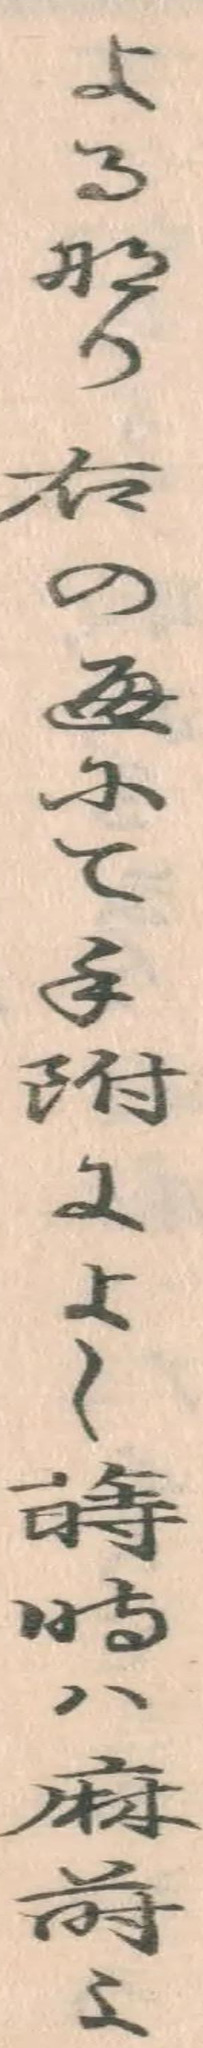よるなり。右の通にて手附によし蒔時は麻蒔よ
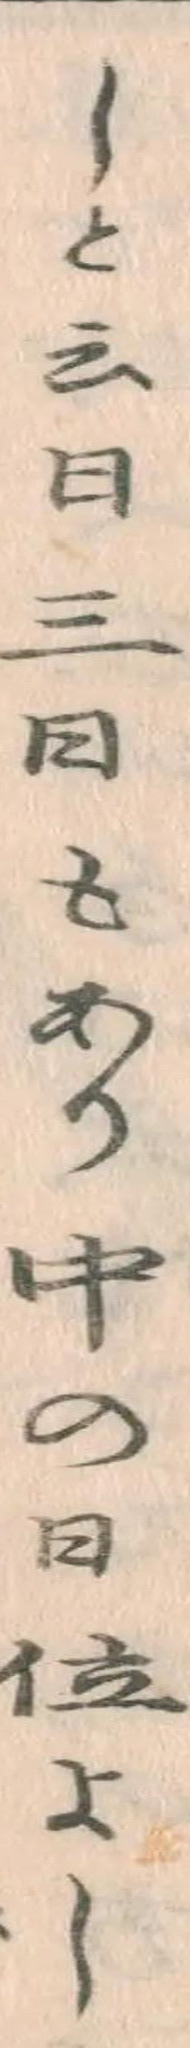しと云日三日もあり中の日位よし
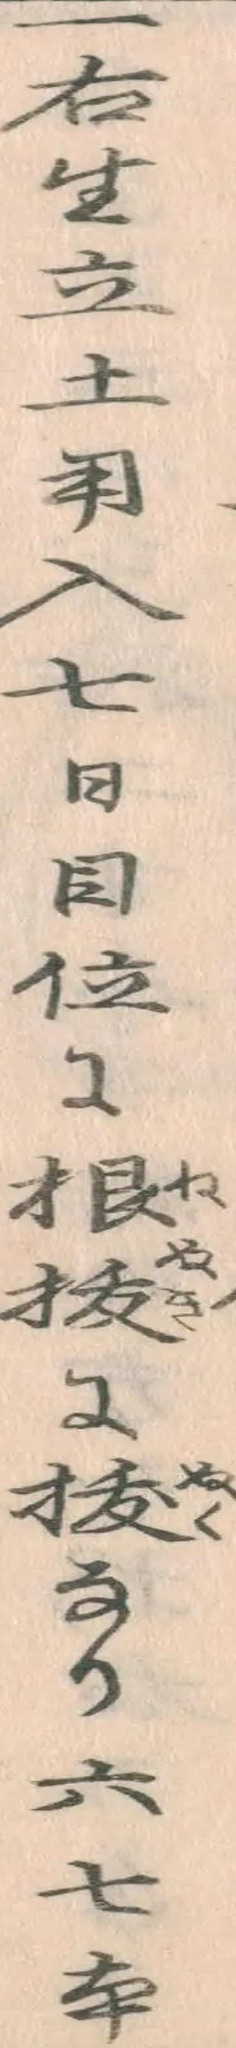一右生立土用入七日目位に根抜に抜なり六七本
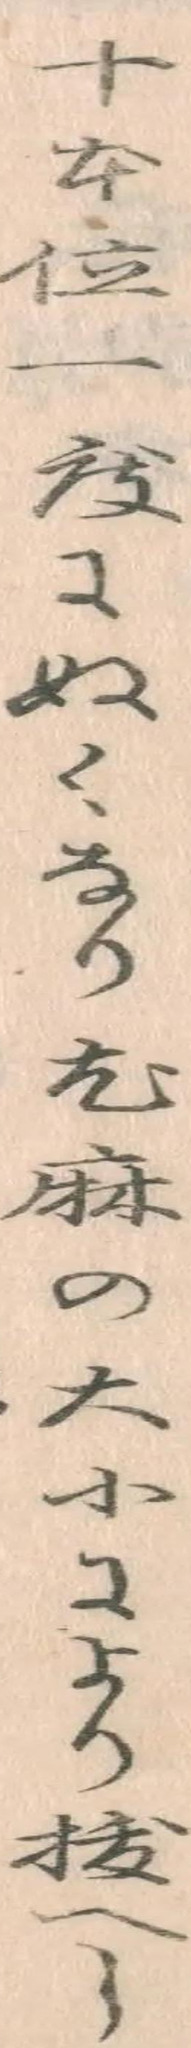十本位一度にぬくなり尤麻の大小により抜へし
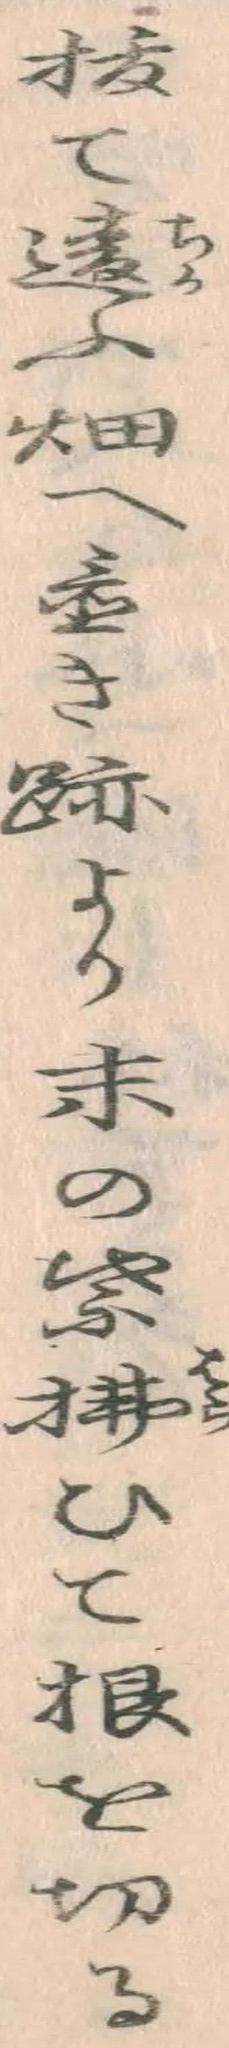抜て違ふ畑へ置き跡より末の葉払ひて根を切る
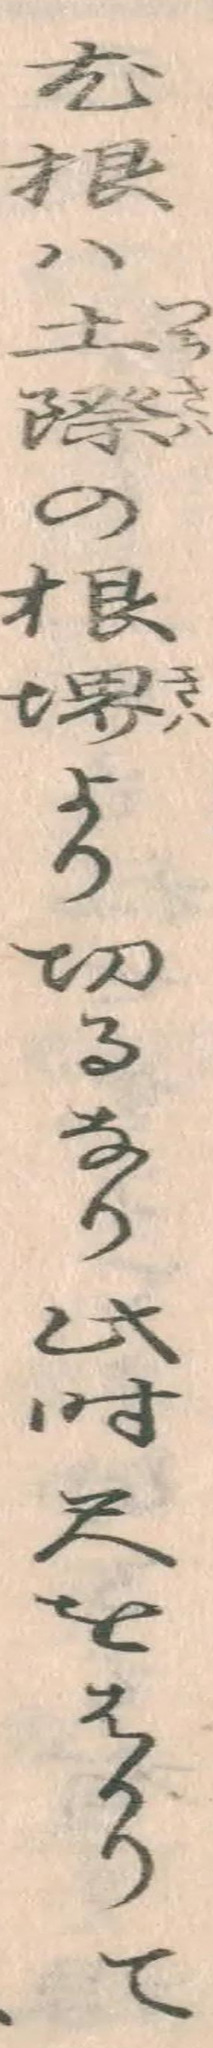尤根は土際の根堺より切るなり此時尺をはかりて
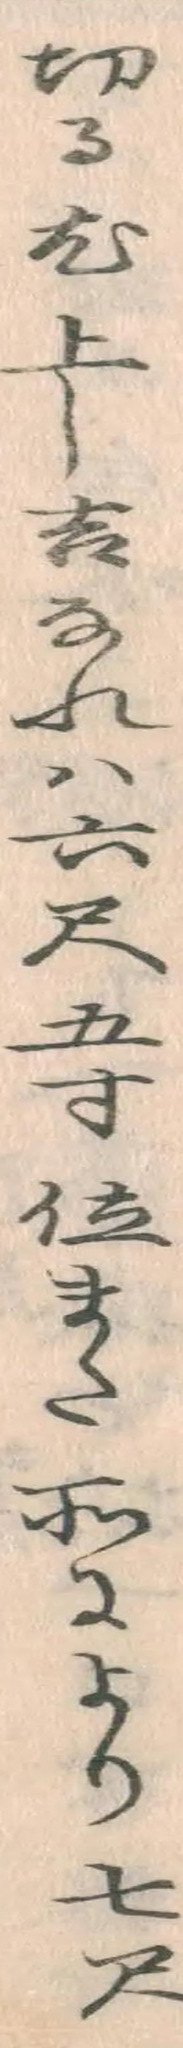切る尤上し吉なれは六尺五寸位また所により七尺
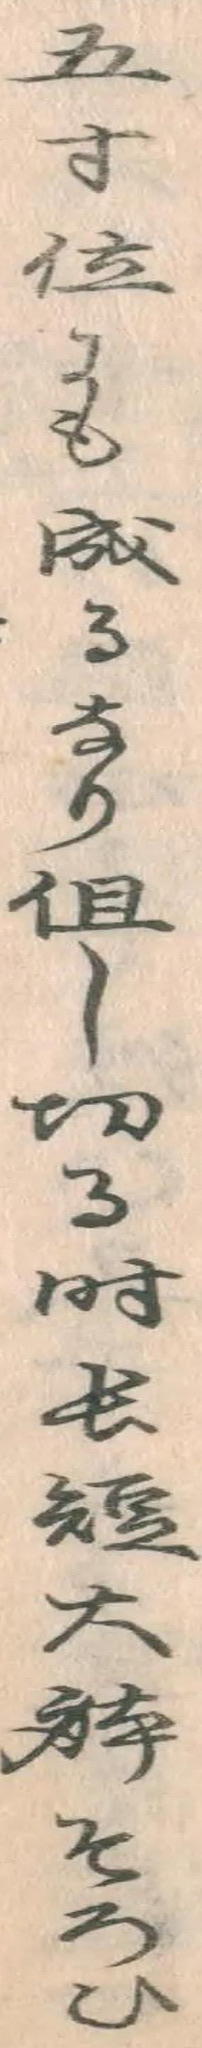五寸位にも成るなり但し切る時長短大体そろひ
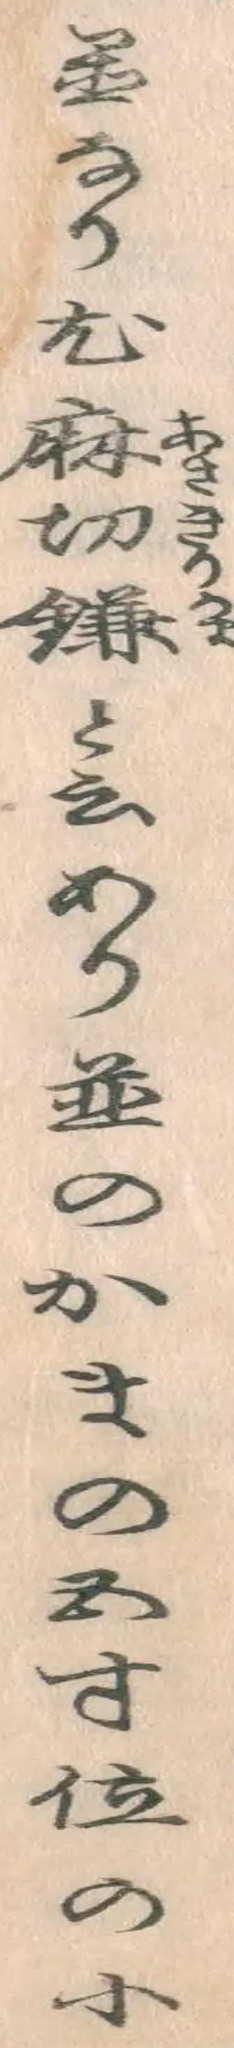置なり尤麻切鎌と云あり並のかまの五寸位の小
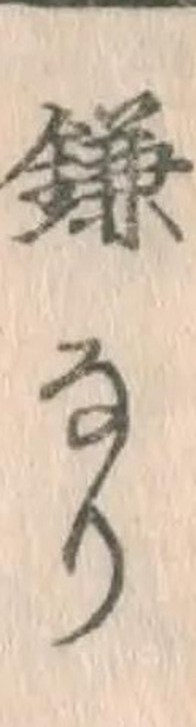鎌なり
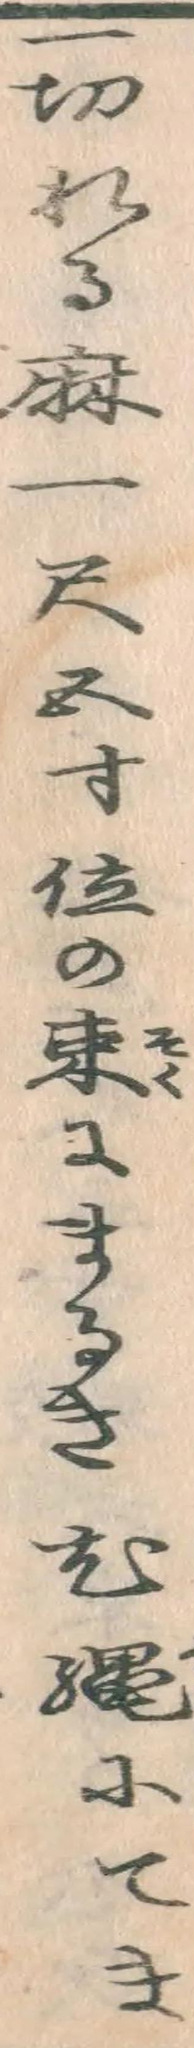一切れる麻一尺五寸位の束にまるき尤縄にてま
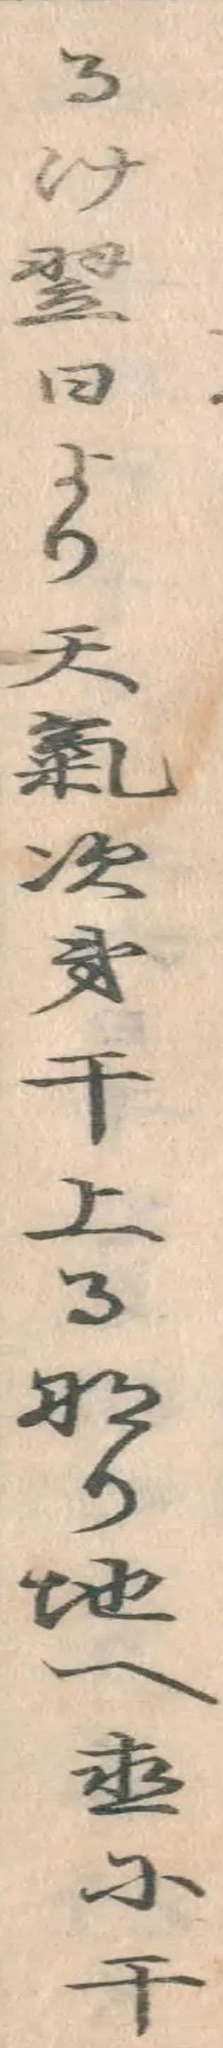るけ翌日より天気次第干上るなり地へ直に干

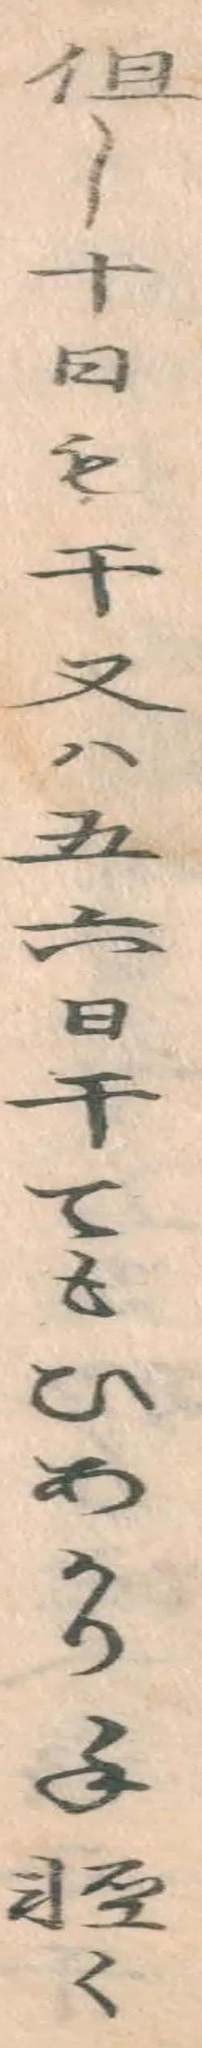但し十日も干又は五六日干てもひあかり手軽く
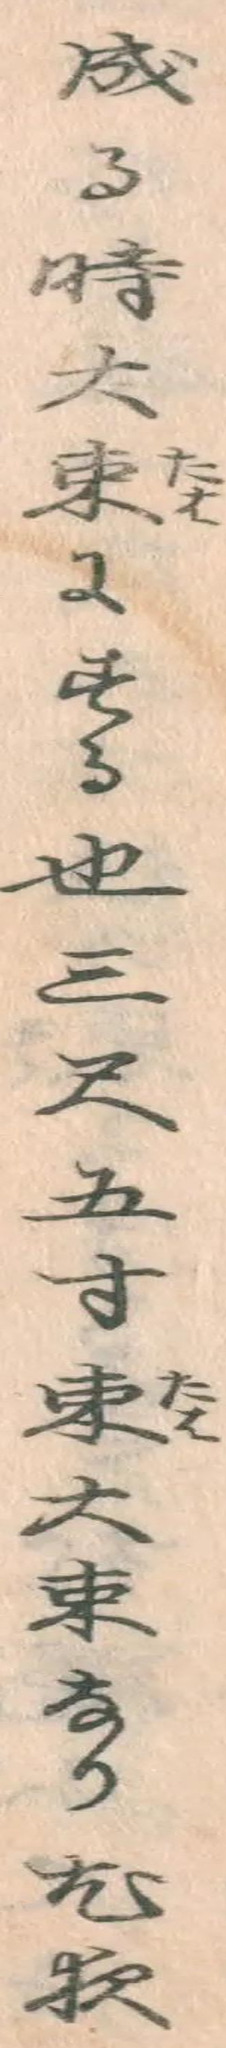成る時大束にする也三尺五寸束大束なり尤夜
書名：機織彙編 5巻. [1]
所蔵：国立国会図書館 National Diet Library, JAPAN
